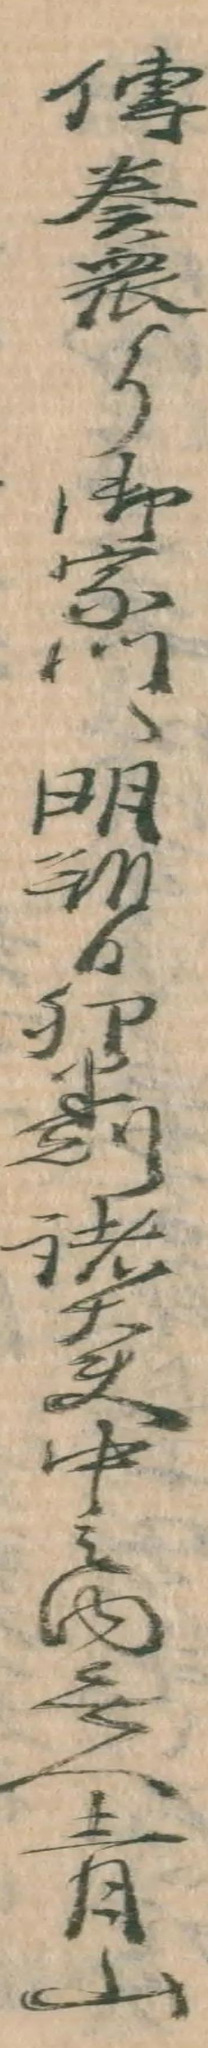傳奏衆より御家門へ明朔日卯半刻諸大夫中之内壱人青山
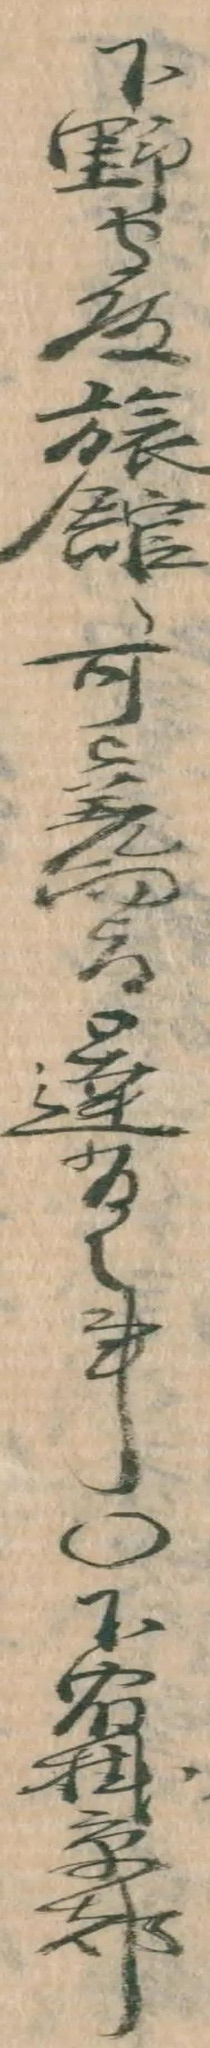下野守殿旅館へ可被差向旨御達有之事○下宿掛京都
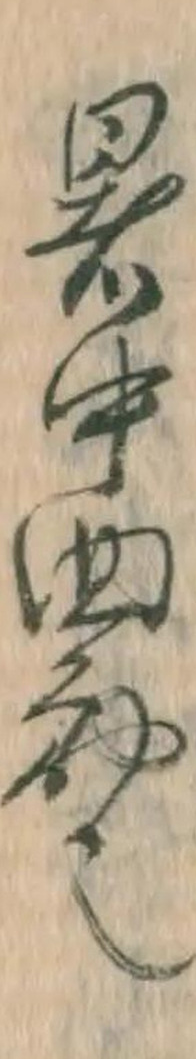暑中回勤之
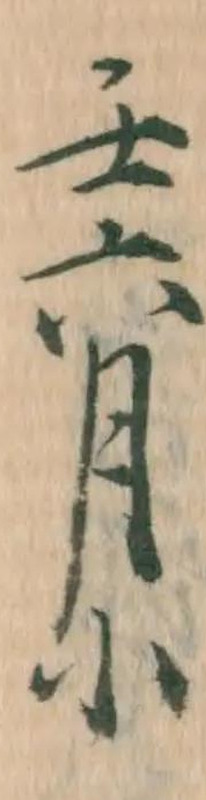壬六月小
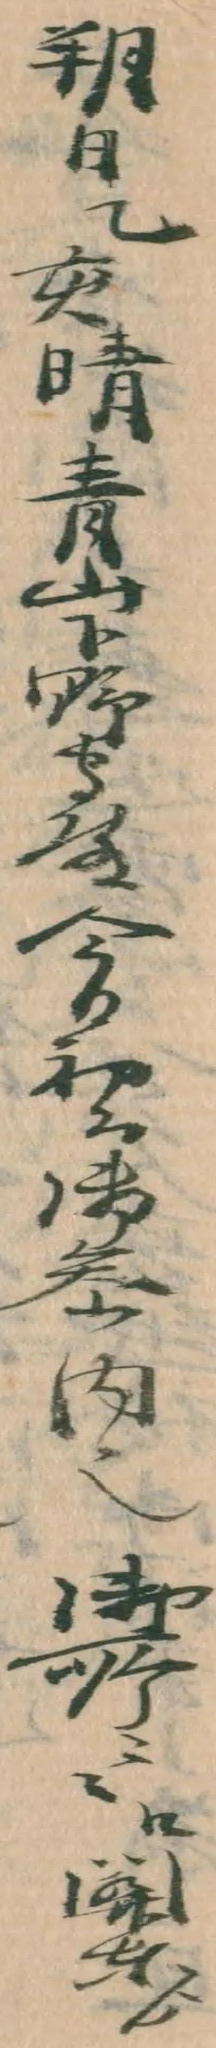朔日乙亥晴青山下野守殿今日初而御参内也御所々々え関東ゟ
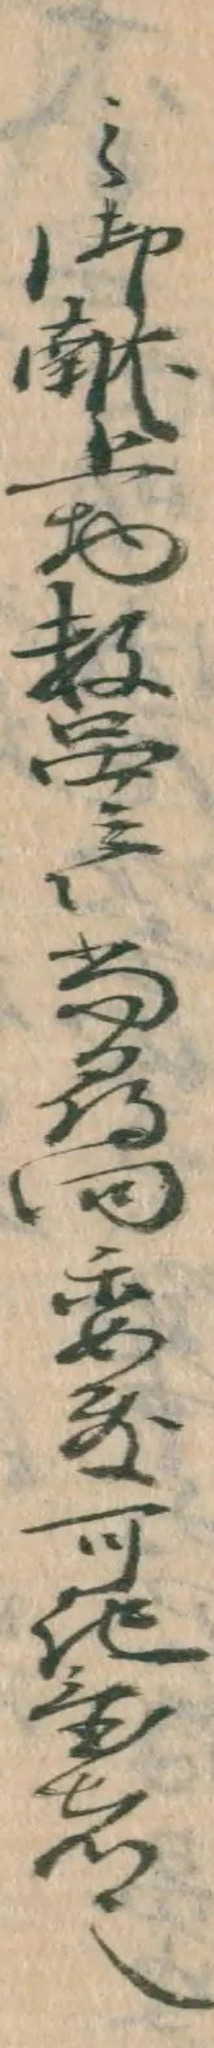之御献上物数品云々尋向委敷可記置者也
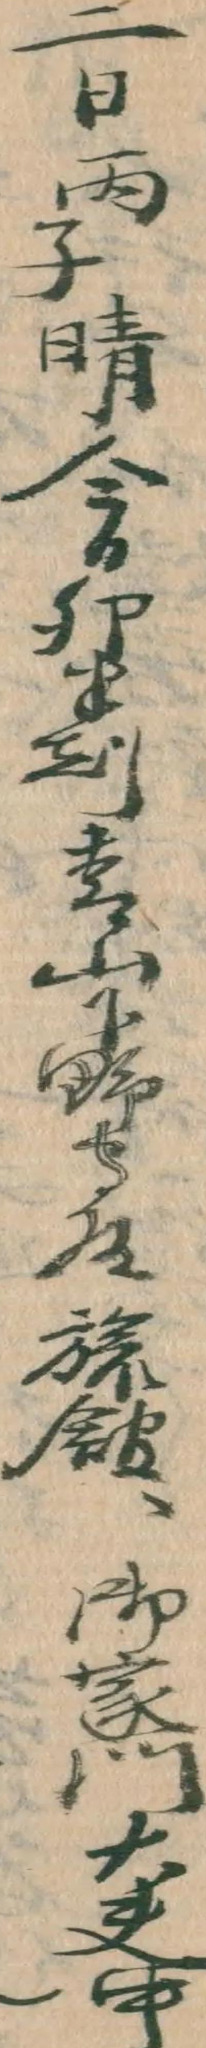二日丙子晴今日卯半刻青山下野守殿旅館へ御家門大夫申
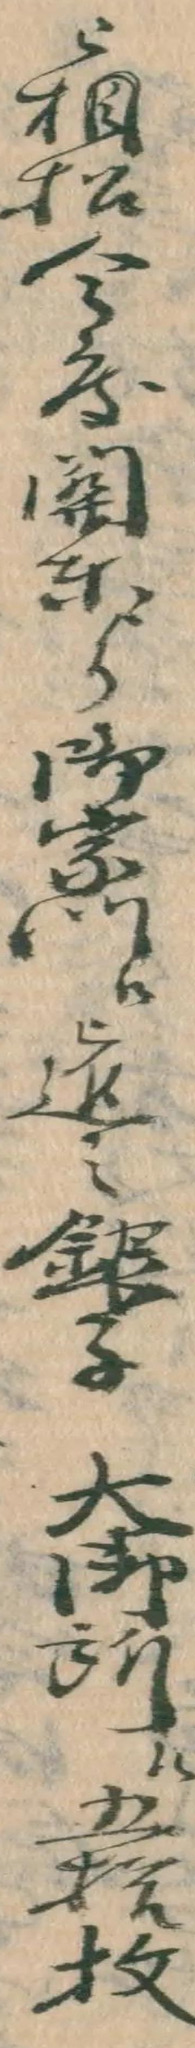被相招今度関東より御家門え被遣之銀子大御所え五拾枚
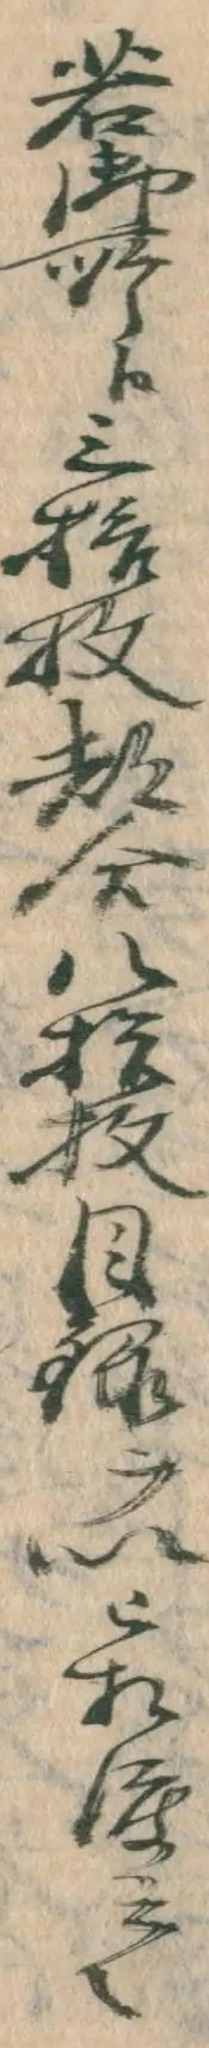若御所え三拾枚都合八拾枚目録ヲ以被相渡云々
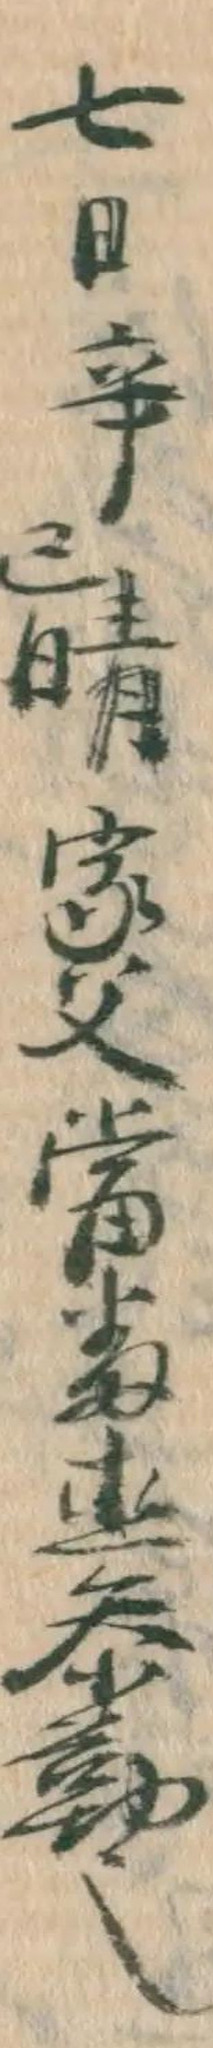七日辛巳晴家父當番直参勤也
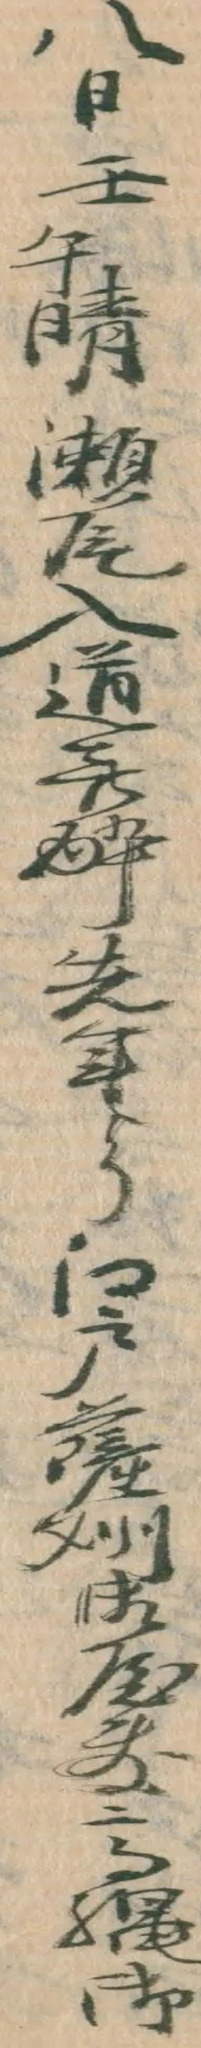八日壬午晴瀬尾入道喜砕先年より江戸薩州御屋敷高縄御
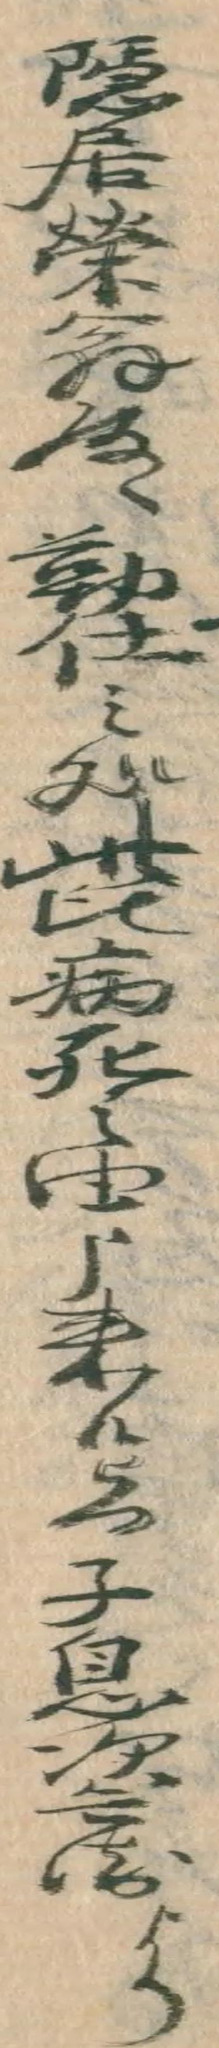隠居栄翁殿へ勤仕之処此比病死之由申来候旨子息次兵衛より
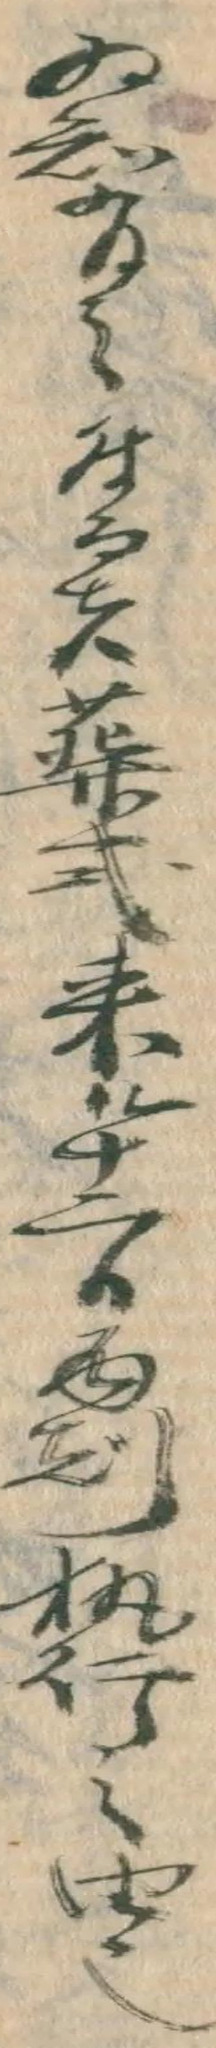為知有之付而は葬式来ル十二日酉刻執行之由也
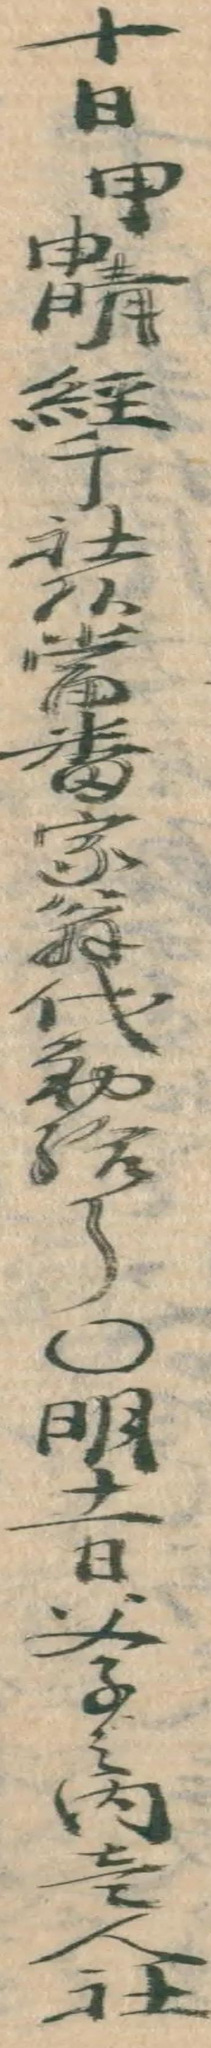十日甲申晴経千社頭當番家翁代勤給了〇明十一日父子之内壱人社
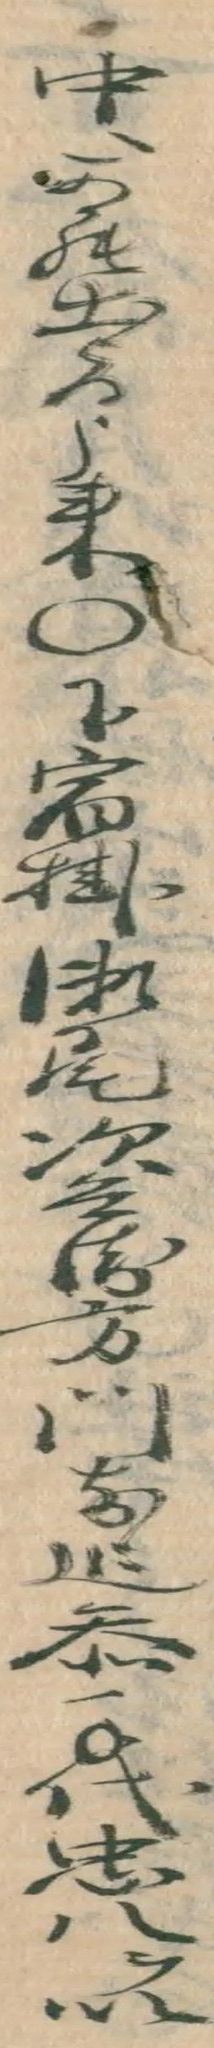中へ可罷出旨申来候〇下宿掛瀬尾次兵衛方門前迄参手代忠八ッヲ以
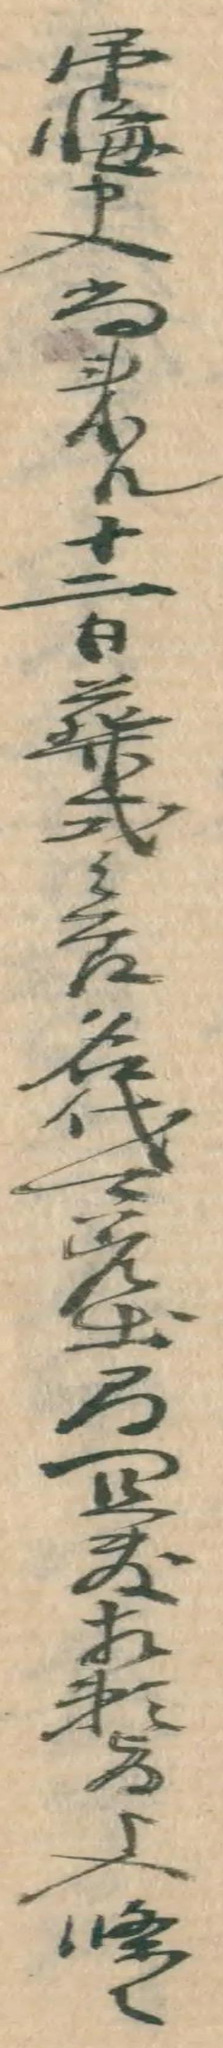帰悔申入尚来ル十二日葬式之節名代可差出間宜敷相頼旨申入條々
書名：賀茂社記録. 第65冊
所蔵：国立国会図書館 National Diet Library, JAPAN
